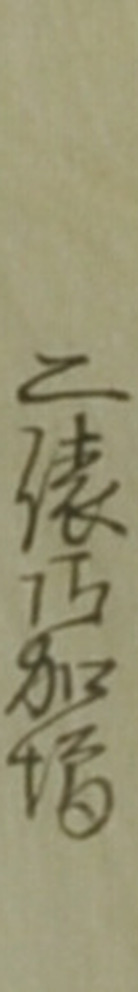二俵御加増
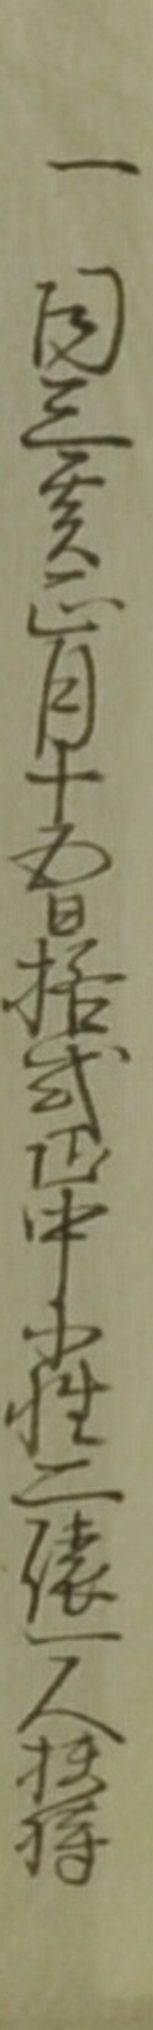一同三亥正月十五日格式御中小性二俵一人扶持
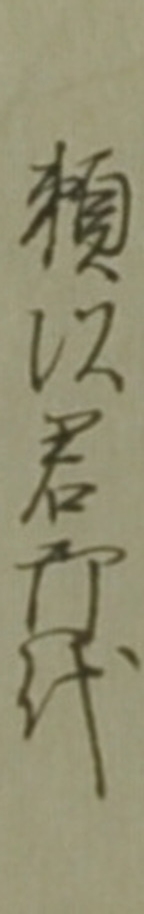頼以後君御代
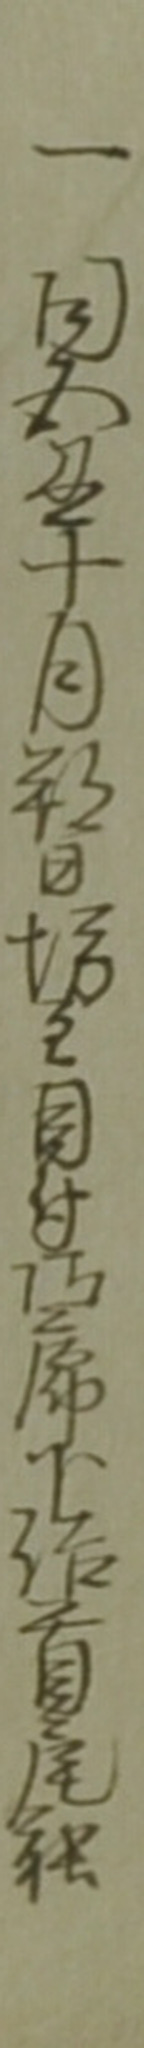一同五丑十月朔日坊主目付御廊下詰首尾能
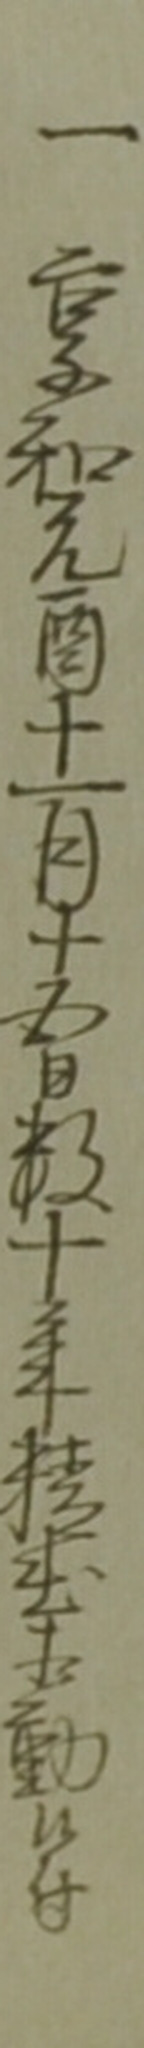一享和元酉十一月十五日数十年精出相勤候付
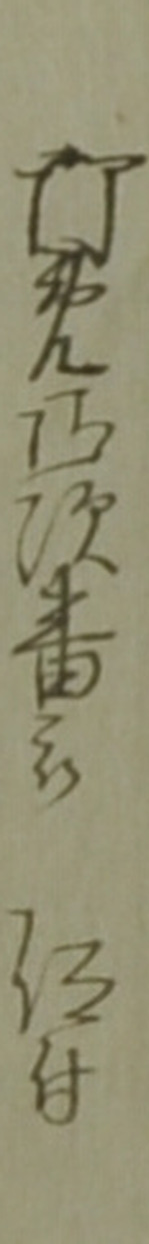御免御次番被仰付
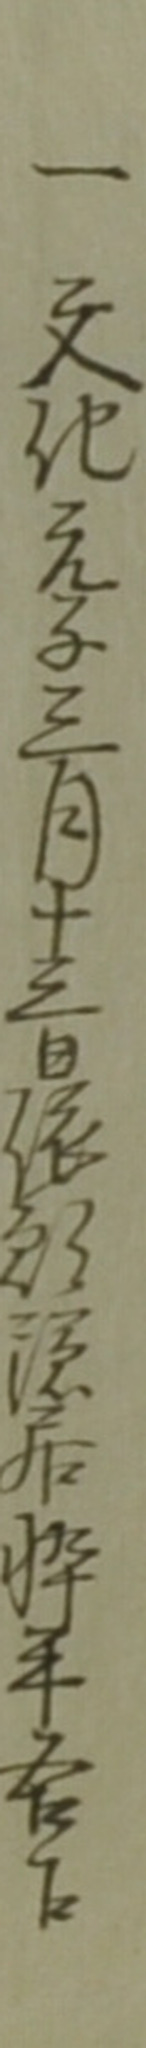一文化元子三月十三日依願隠居忰平吾江
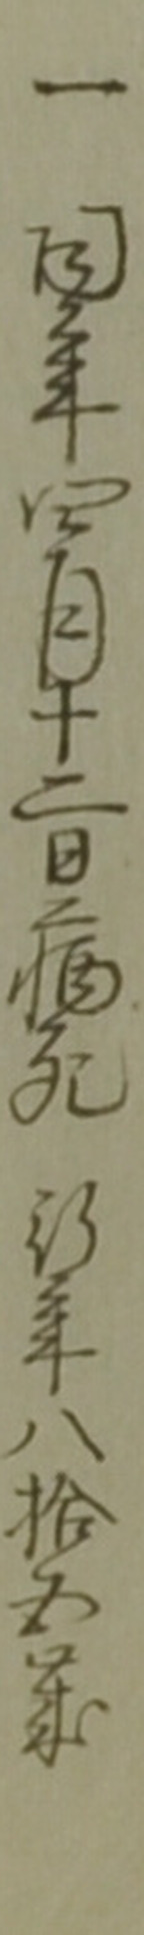一同年四月十二日病死行年八拾五歳
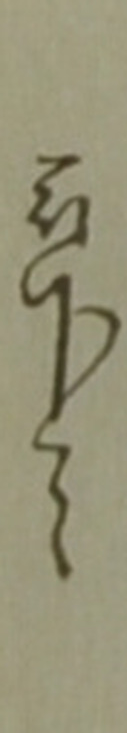被下之
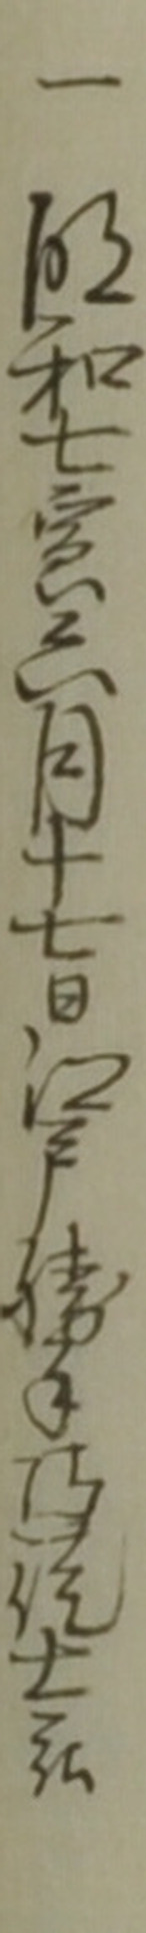一明和七寅六月十七日江戸勝手御徒士被
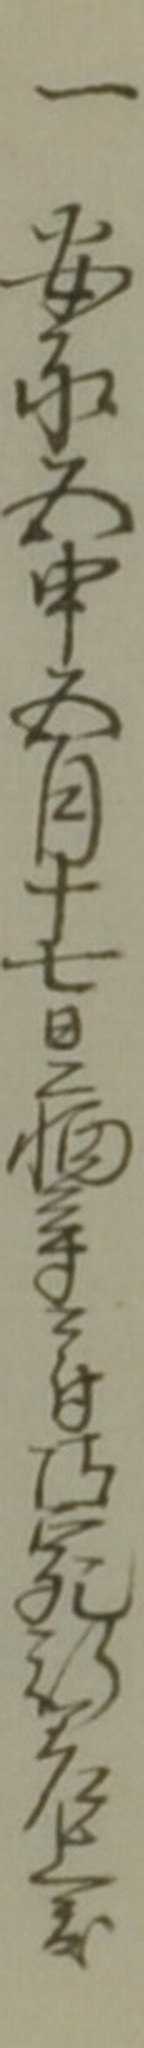一安永五申五月十七日病気ニ付御宛行差上度
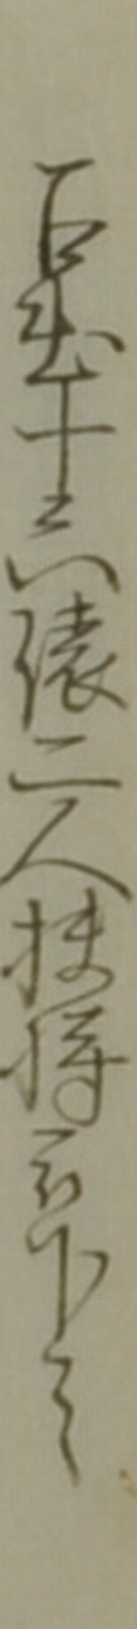召出十六俵二人扶持被下之
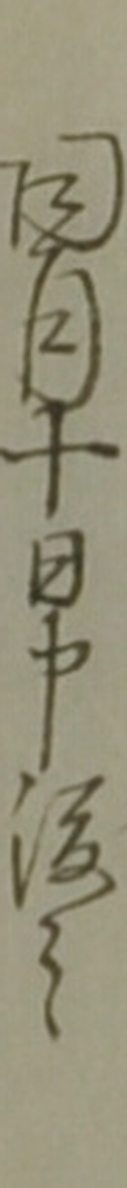同月十日申渡之
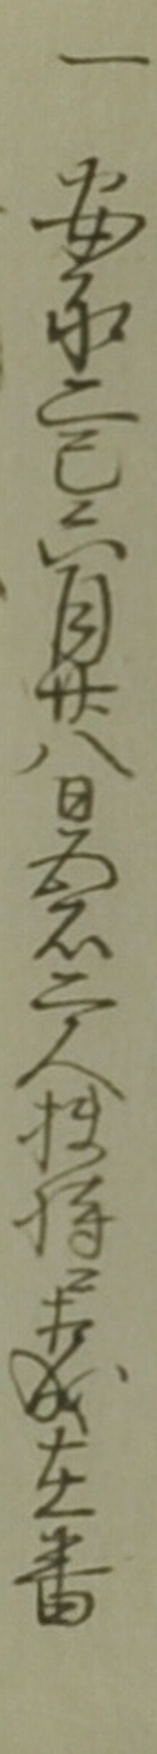一安永二巳六月廿八日五石二人ニ相成在番
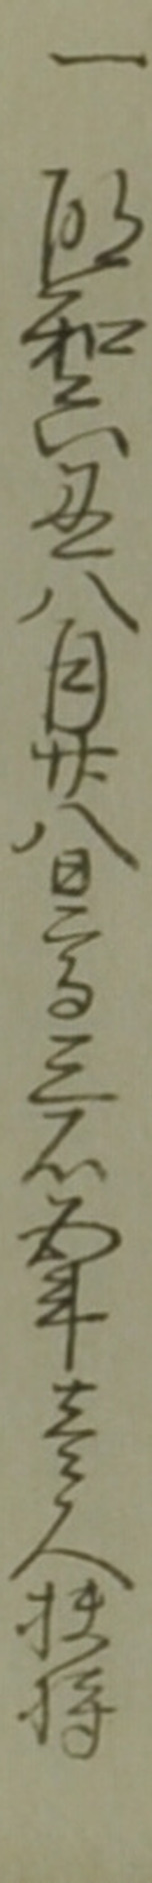一明和六丑八月廿八日高三石五斗壱人扶持

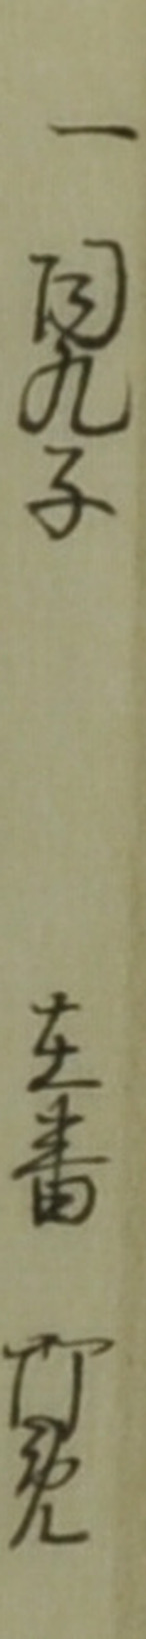一同九子在番御免
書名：無足諸士勤仕録（二）
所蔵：伊那市立高遠町図書館・合同会社AMANE
